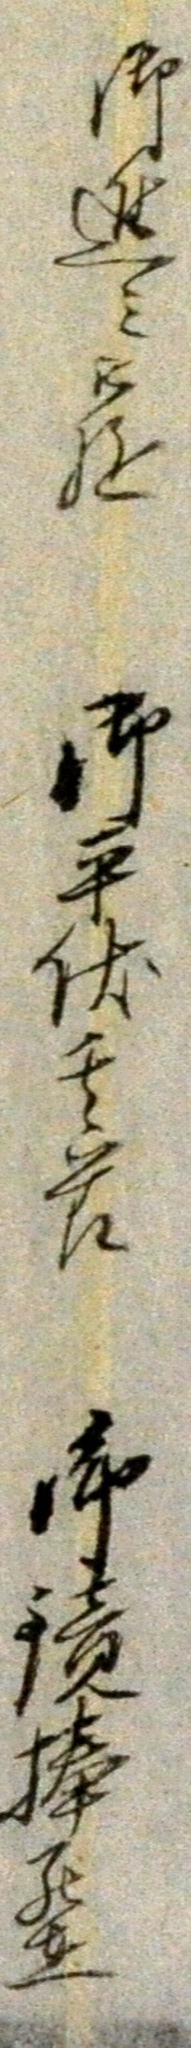御進ミ被遊御平伏其節御鏡捧罷在
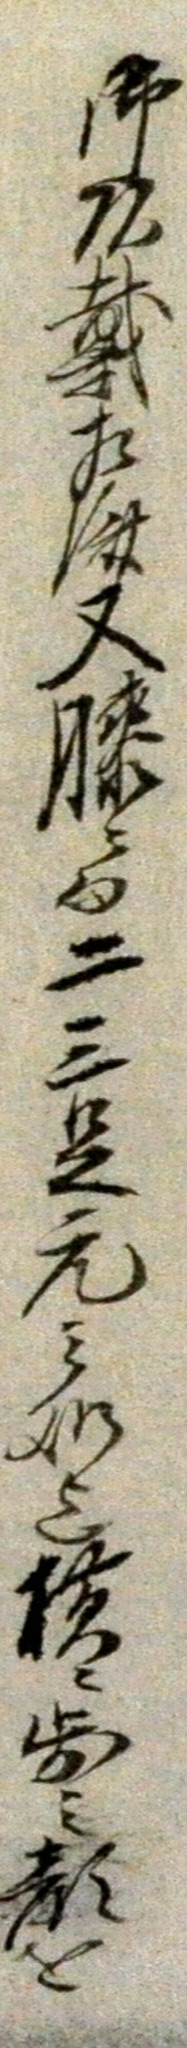御頂戴相済又膝ニ而二三足元之処迄横ニ歩ミ顔を
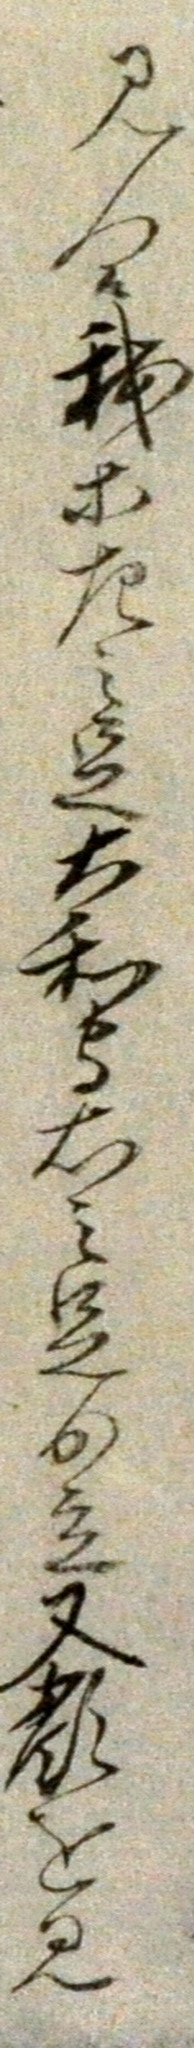見合我等左之足大和守右之足ゟ立又顔を見
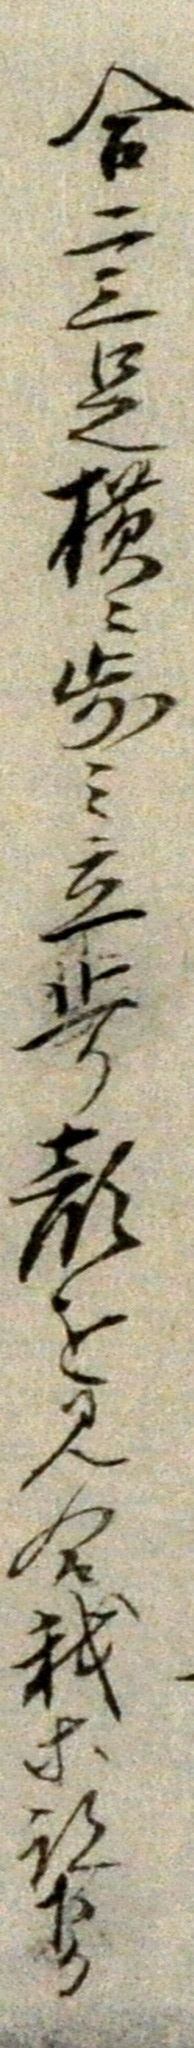合二三足横ニ歩ミ立止り顔を見合我等跡下り
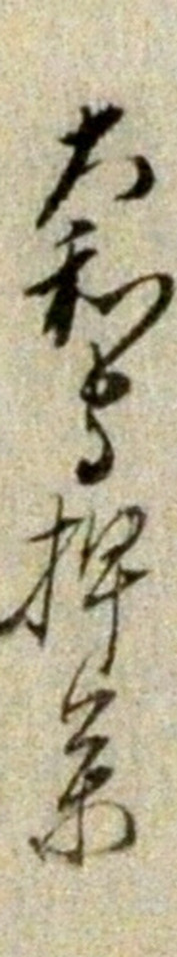大和守押参
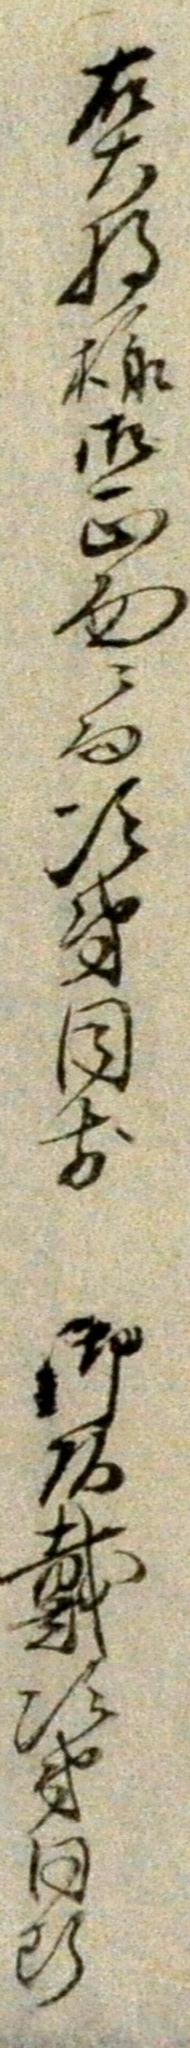右大将様御正面ニ而次第同前御頂戴次第同断
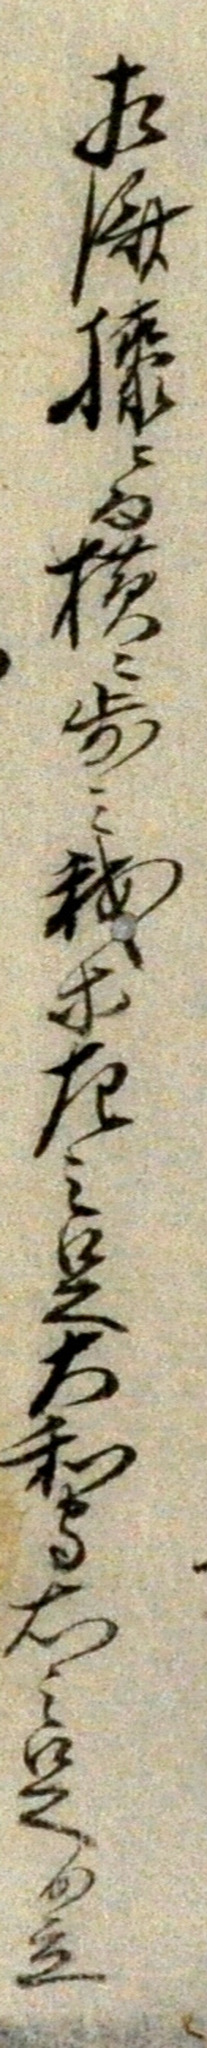相済膝ニ而横ニ歩ミ我等左之足大和守右之足ゟ立
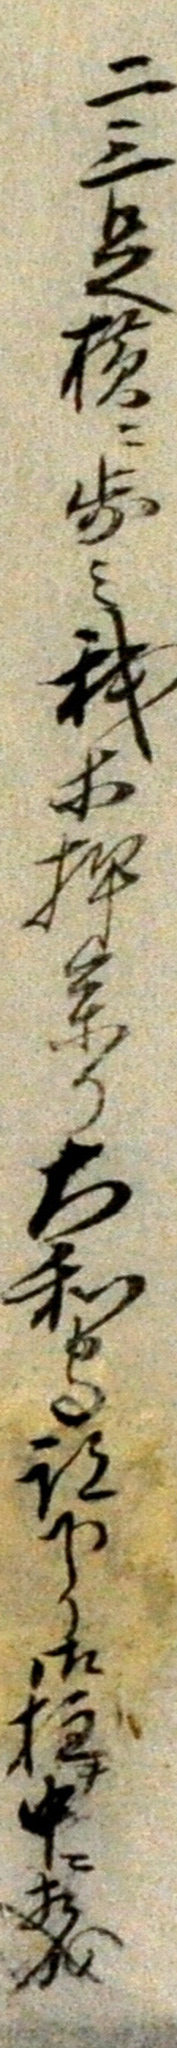二三足横ニ歩ミ我等押参り大和守跡下り御柱ヲ中ニ相成
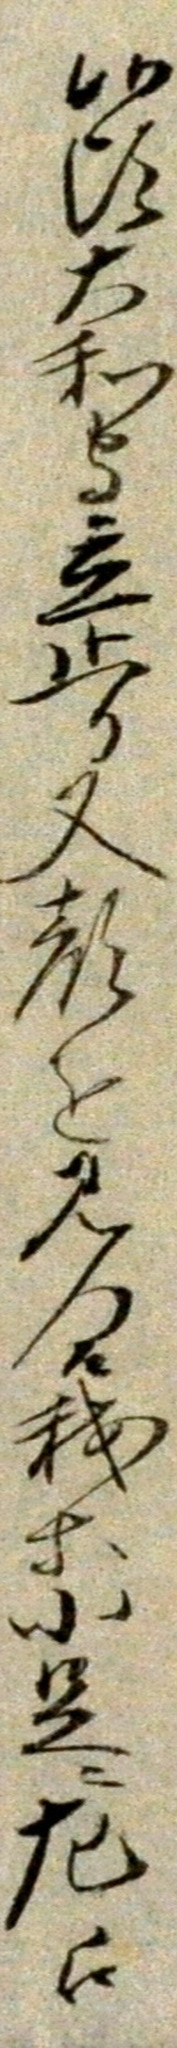候頃大和守立止り又顔を見合我等小足ニ左え
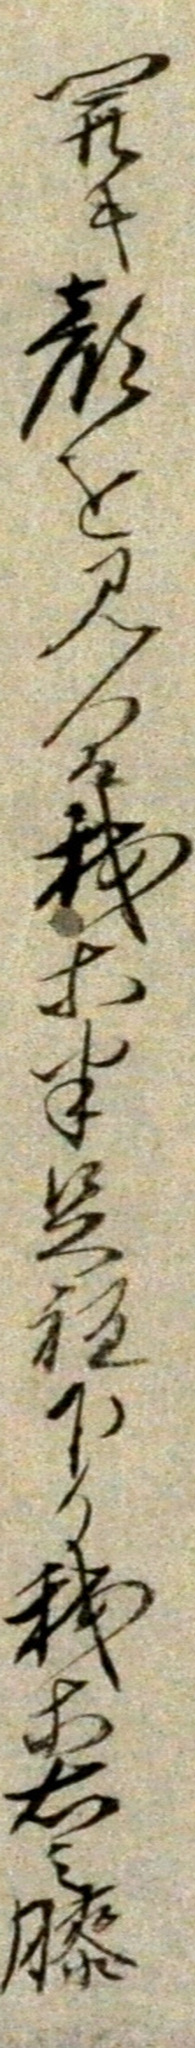開キ顔を見合我等半足程下り我等右之膝
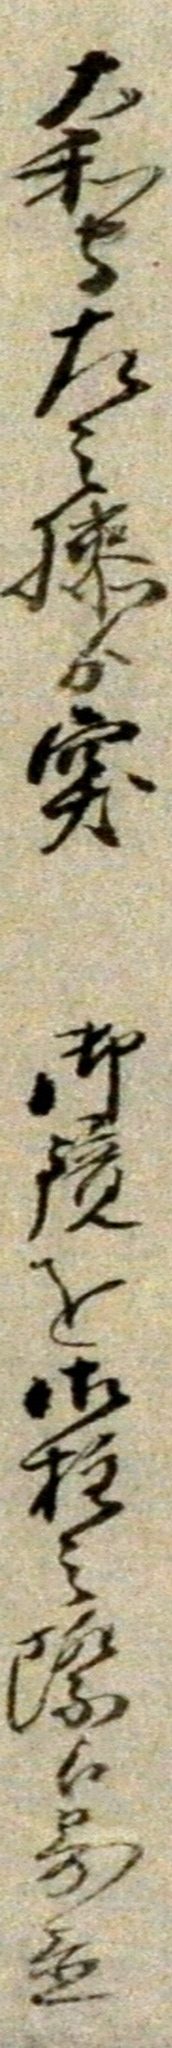大和守左之膝ゟ突御鏡を御柱之際え寄置
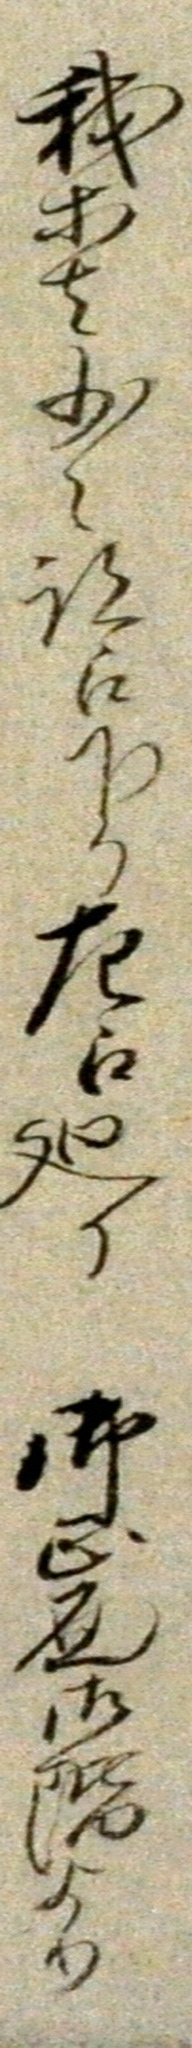我等は少々跡え下り左え廻り御正面御階より
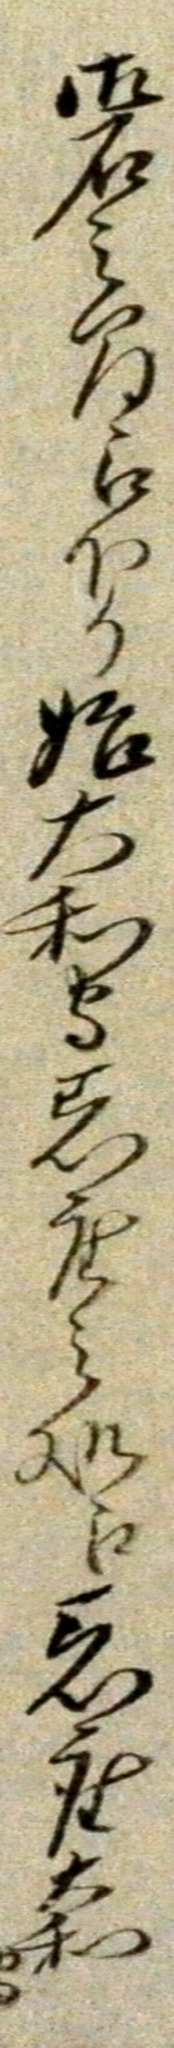御石之間え下り始大和守着座之処え着座大和守
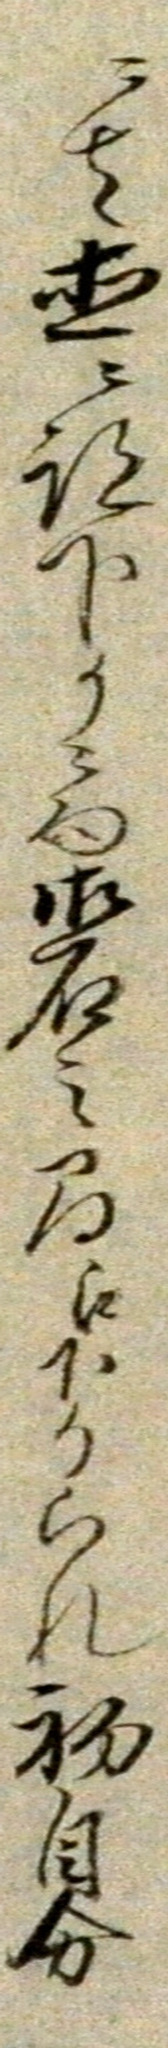ニは直ニ跡下りニ而御石之間え下りられ初自分
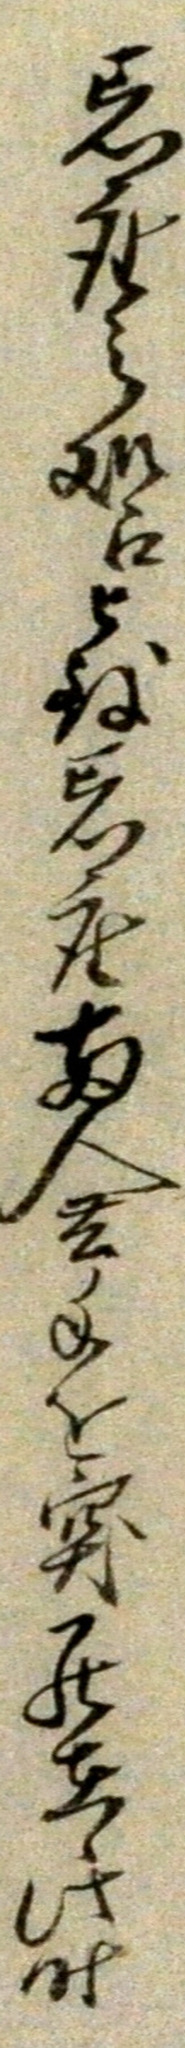着座之処え被致着座両人共手を突罷在候此時
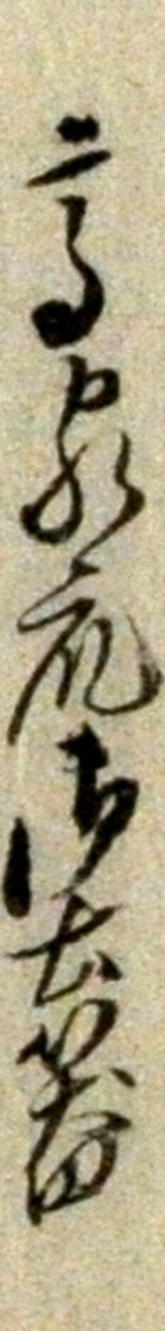高家衆御土器
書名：御鏡餅御用留（写）
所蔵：伊那市立高遠町図書館・合同会社AMANE
